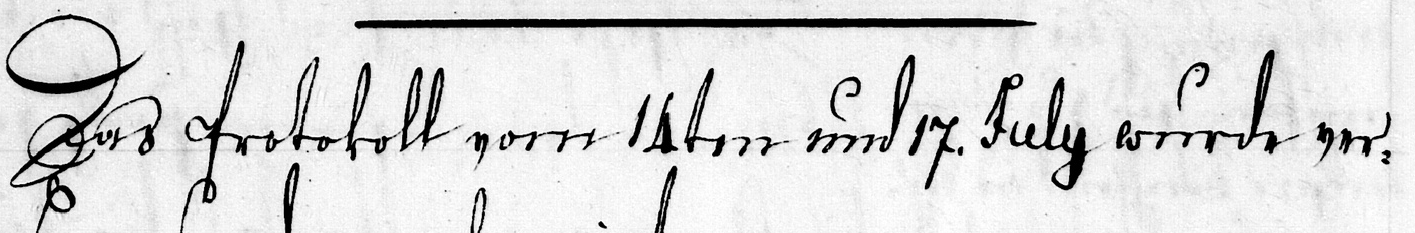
Das Protokoll vom 14ten und 17. July wurde ver¬
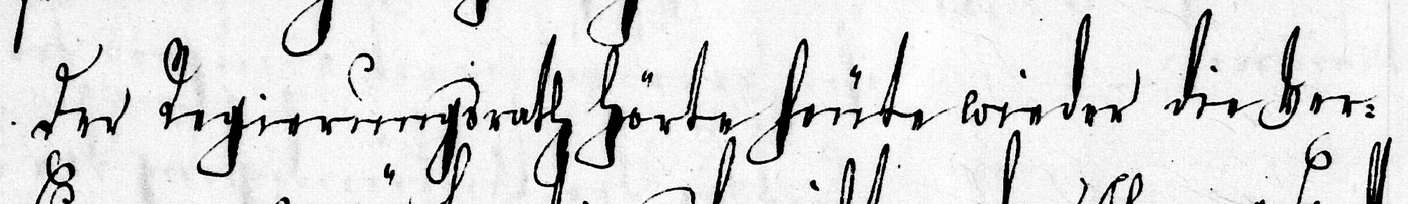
Der Regierungsrath hörte heute wieder die Ver¬
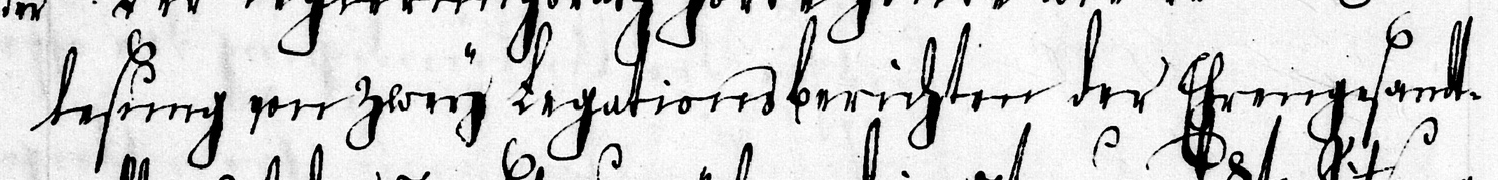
lesung von zwey Legationsberichten der Ehrengesandt¬
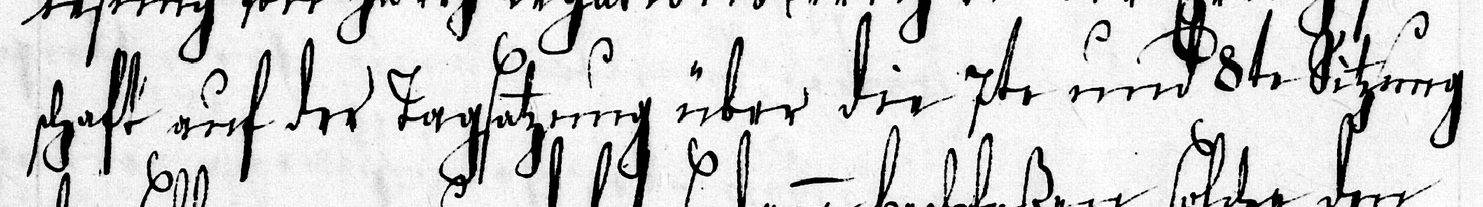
schaft auf der Tagsatzung über die 7te und 8te Sitzung
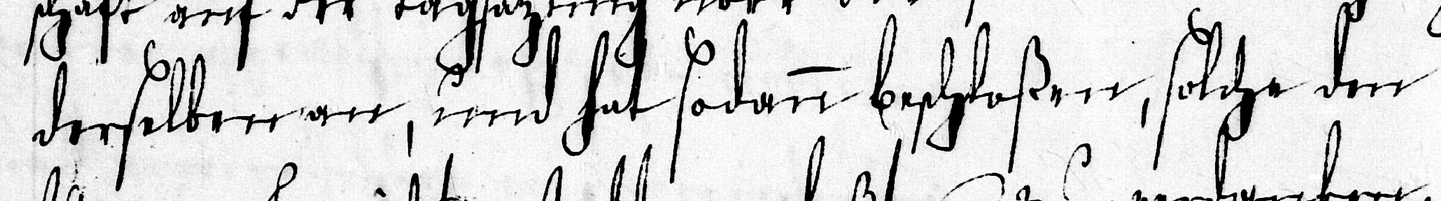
derselben an, und hat sodann beschloßen, solche den
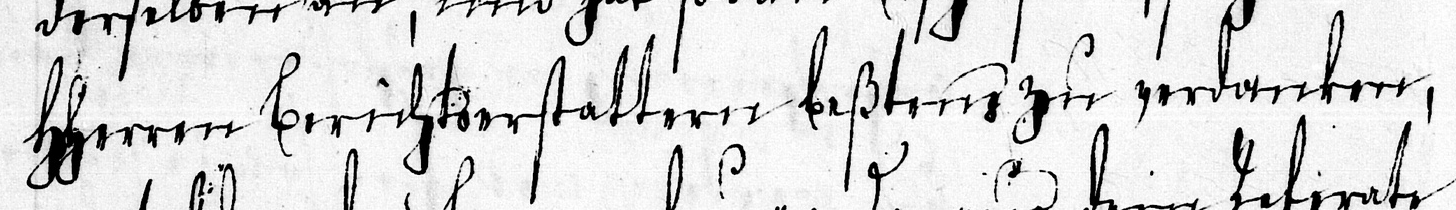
HHerren Berichtserstattern beßtens zu verdanken,
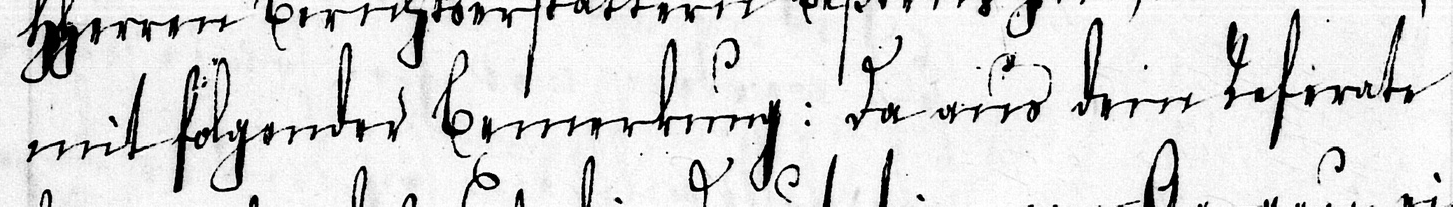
mit folgender Bemerkung: Da aus dem Referate
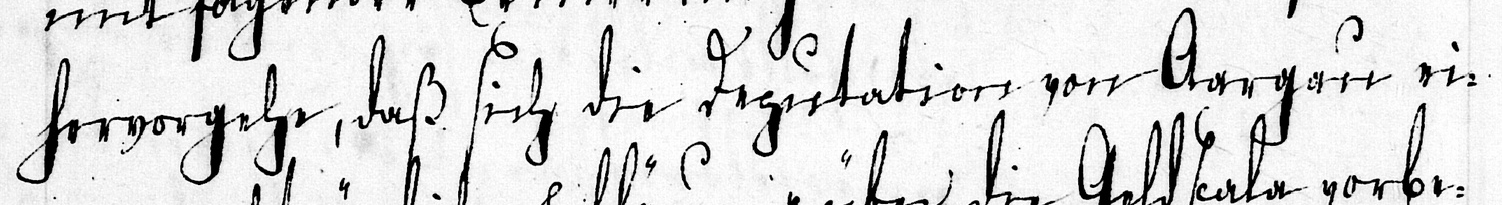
hervorgehe, daß sich die Deputation von Aargau ei¬
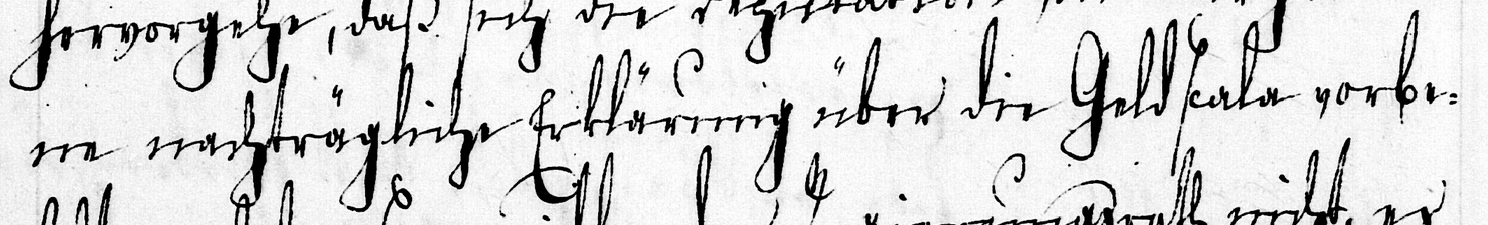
ne nachträgliche Erklärung über die Geldscala vorbe¬
